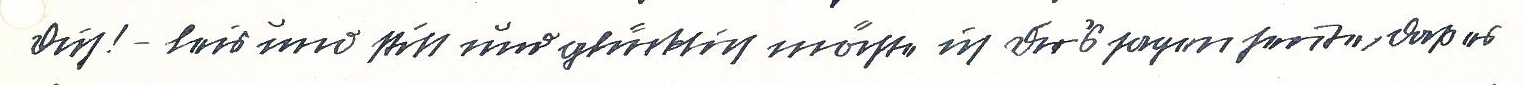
Dich! – leis und still und glücklich möchte ich Dir’s sagen heute, daß es
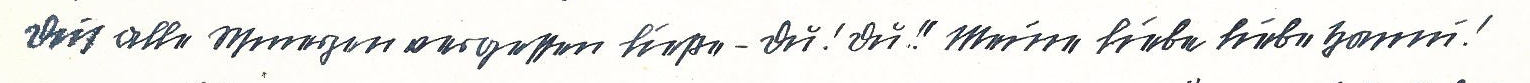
Dich alle Schmerzen vergessen ließe – Du! Du!! meine liebe, liebe!
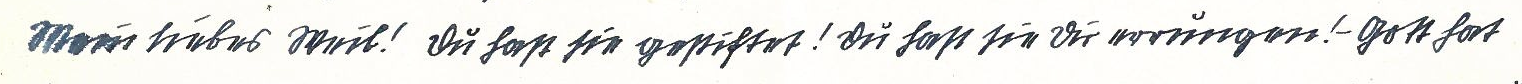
Mein liebes Weib! Du hast sie gestiftet! Du hast sie Dir errungen – Gott hat
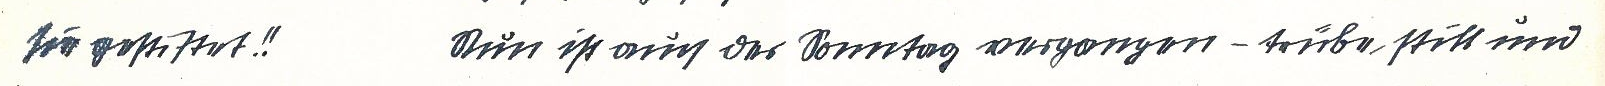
sie gestiftet!! Nun ist auch der Sonntag vergangen – trübe, still und
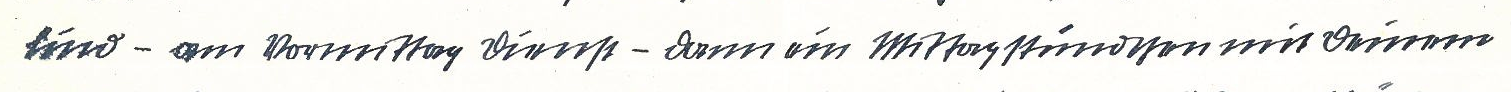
lind – am Vormittag Dienst – dann ein Mittagsstündchen mit Deinem
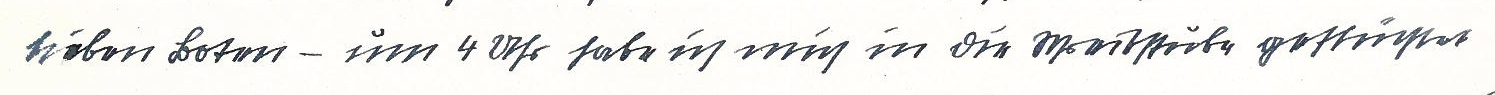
lieben Boten – um 4 Uhr habe ich mich in die Schreibstube geflüchtet
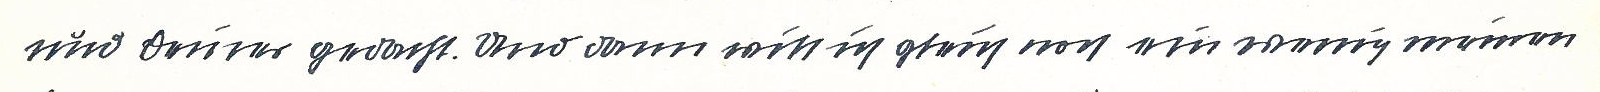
und Deiner gedacht! Und dann will ich gleich noch ein wenig meinen
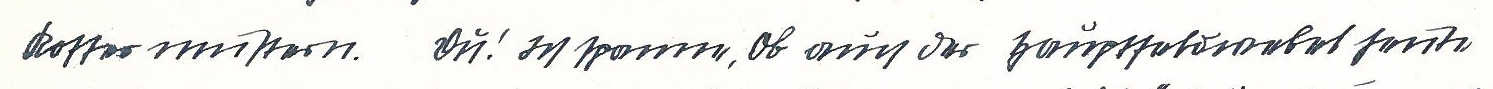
Koffer mustern. Du! Ich spanne, ob auch der Hauptfeldwebel heute
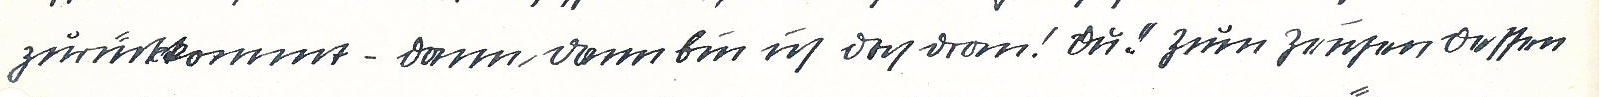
zurückkommt – dann, dann bin ich dran! Du!! Zum Zeichen dessen
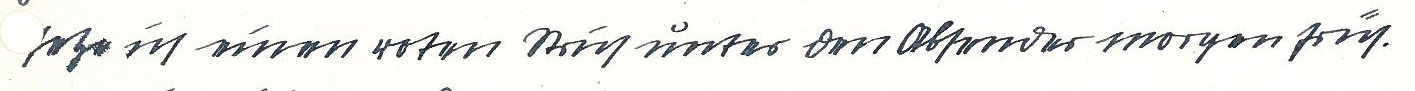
etze ich einen roten Strich unter den Absender morgen früh.
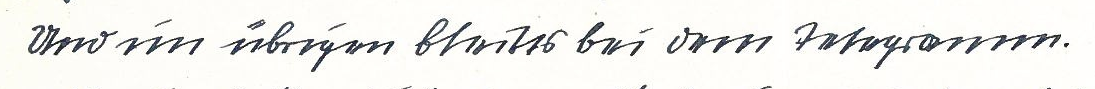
Und im übrigen bleibts bei dem Telegramm.
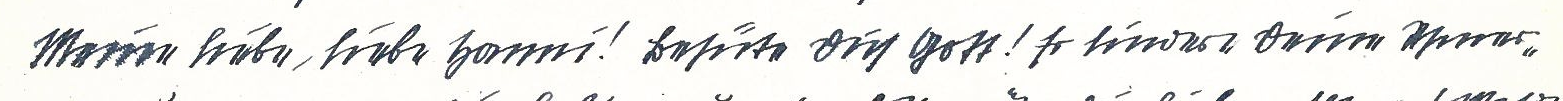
Meine liebe, liebe ! Behüte Dich Gott! Er lindere Deine Schmer¬
